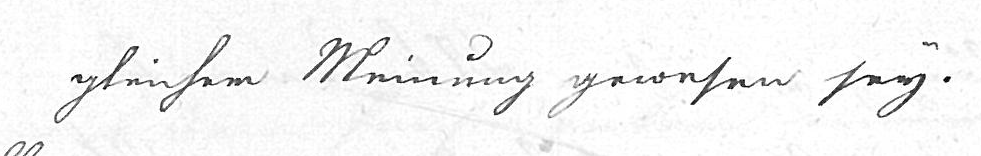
gleichen Meinung gewesen sey.
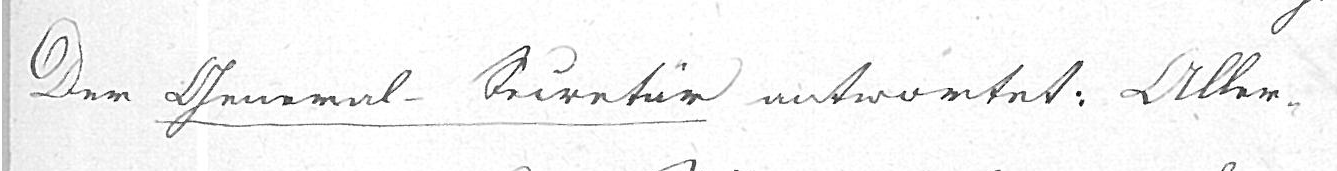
Der General-Secretär antwortet: Aller-
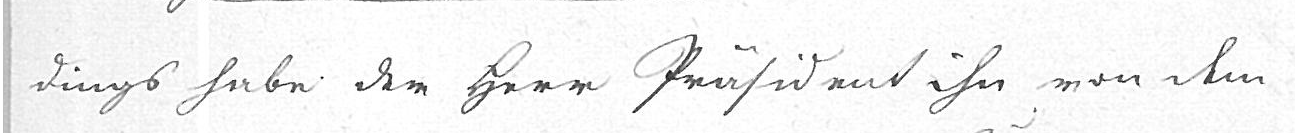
dings habe der Herr Präsident ihn von dem
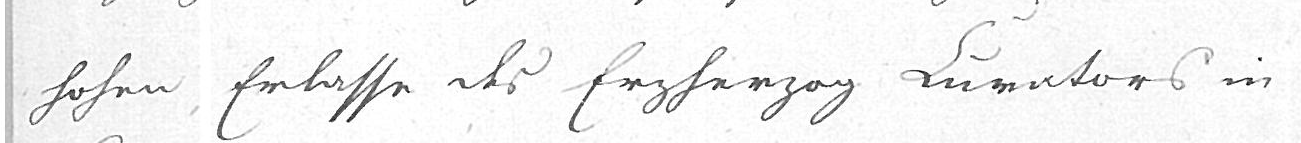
hohen Erlasse des Erzherzog Curators in
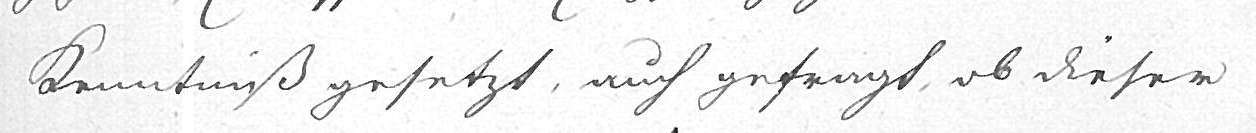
Kenntniß gesetzt, auch gefragt, ob dieser
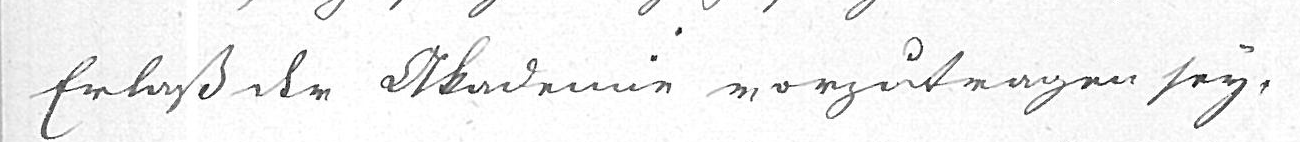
Erlaß der Akademie vorzutragen sey.
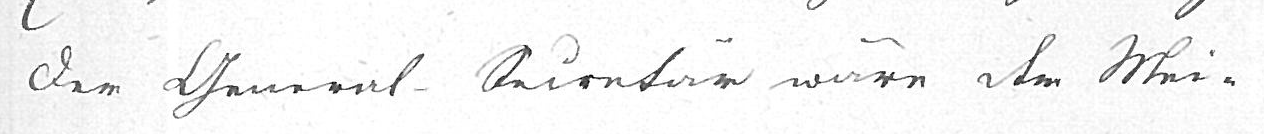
Der General-Secretär wäre der Meinung
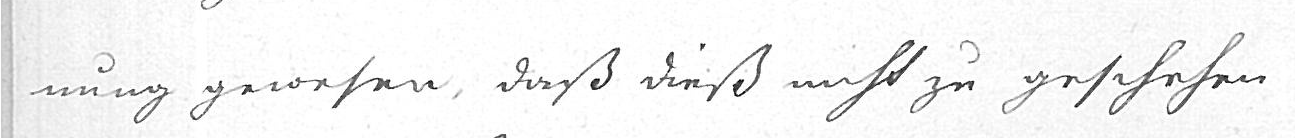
gewesen, daß dieß nicht zu geschehen
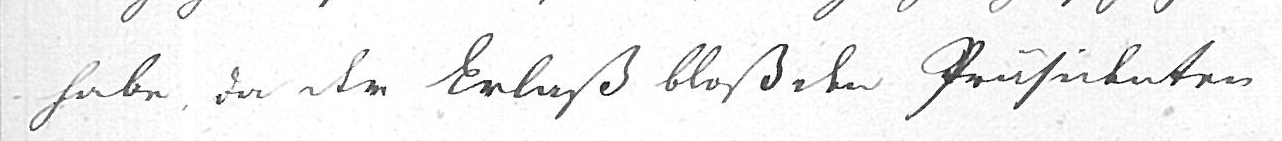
habe, da der Erlaß bloß den Präsidenten
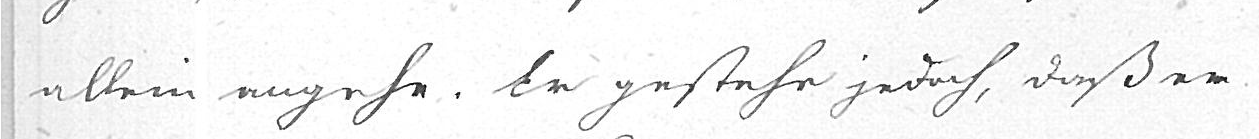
allein angehe. Er gestehe jedoch, daß er
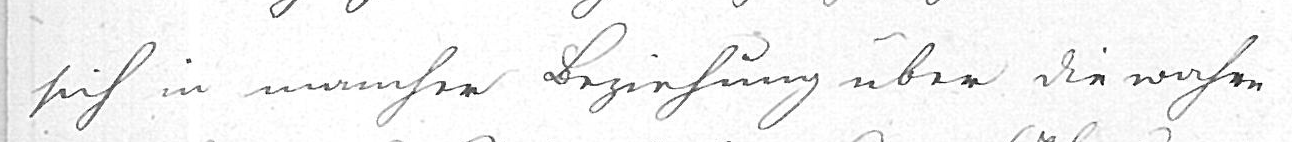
sich in mancher Beziehung über die wahre
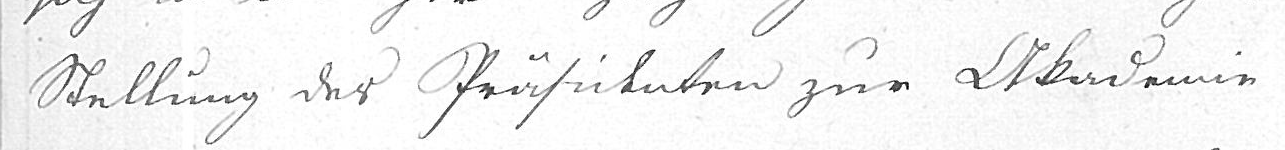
Stellung des Präsidenten zur Akademie
